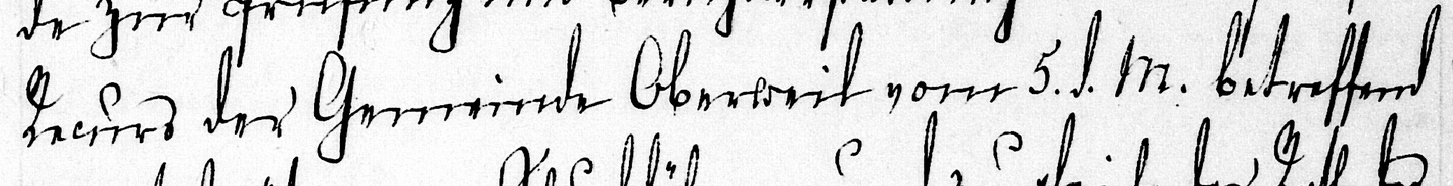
Recurs der Gemeinde Oberweil vom 5. d. M. betreffend
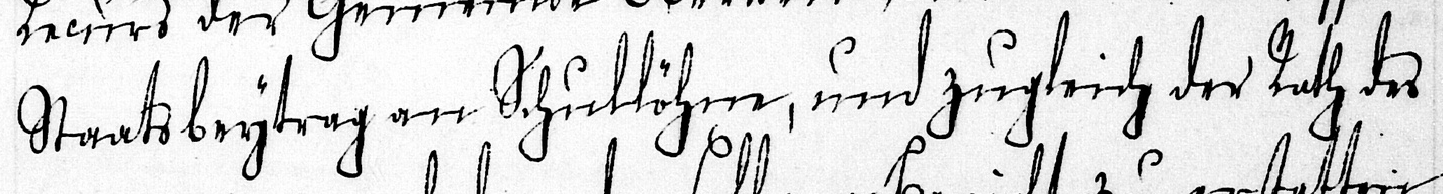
Staatsbeytrag an Schullöhne, und zugleich der Rath des
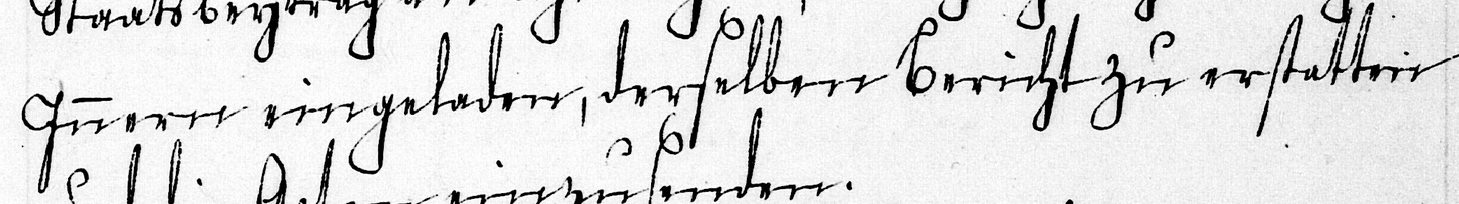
Innern eingeladen, derselben Bericht zu erstatten
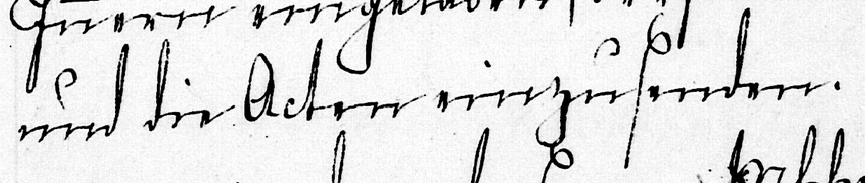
und die Acten einzusenden.
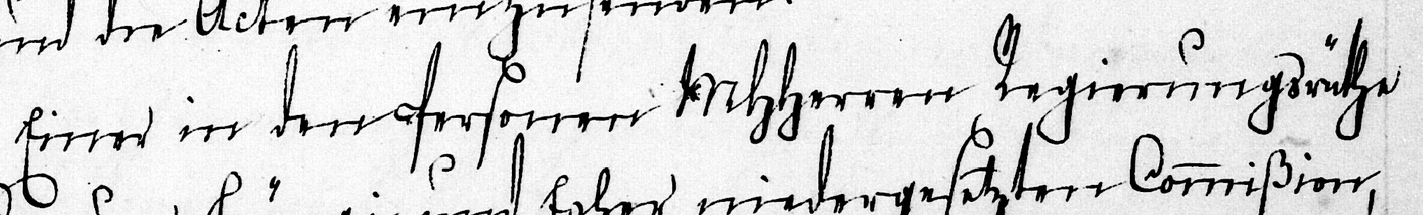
Einer in den Personen MHHerren Regierungsräthe
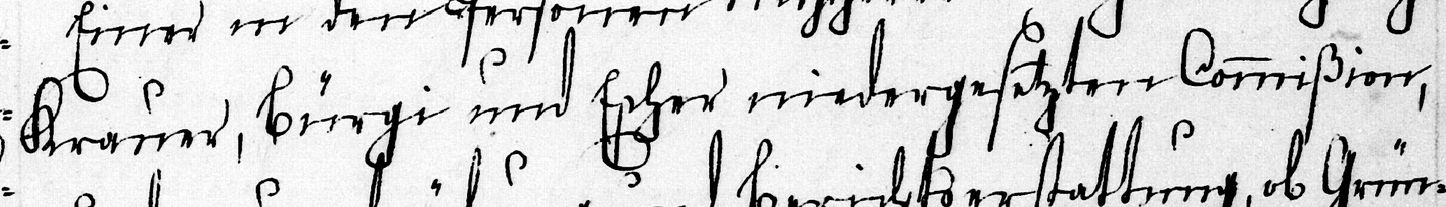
Krauer, Bürgi und Escher niedergesetzten Commißion,
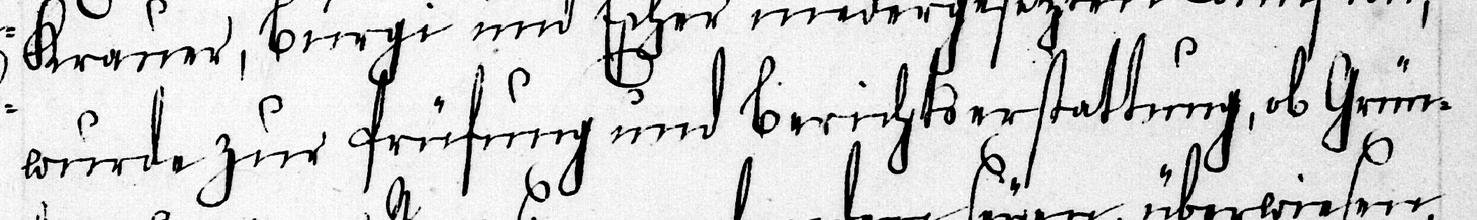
wurde zur Prüfung und Berichtserstattung, ob Grün¬
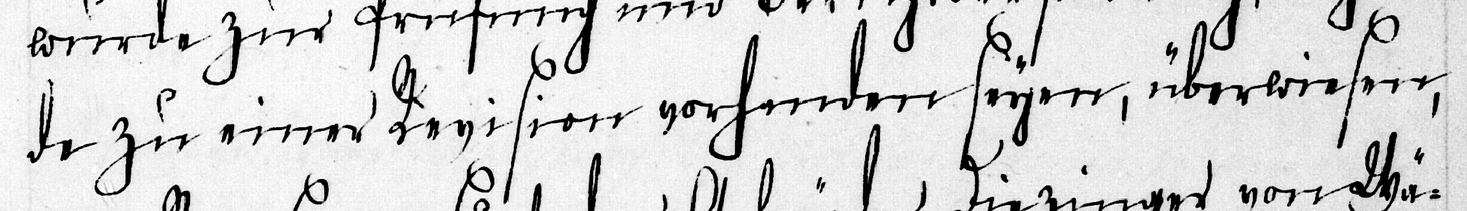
de zu einer Revision vorhanden seyen, überwiesen,
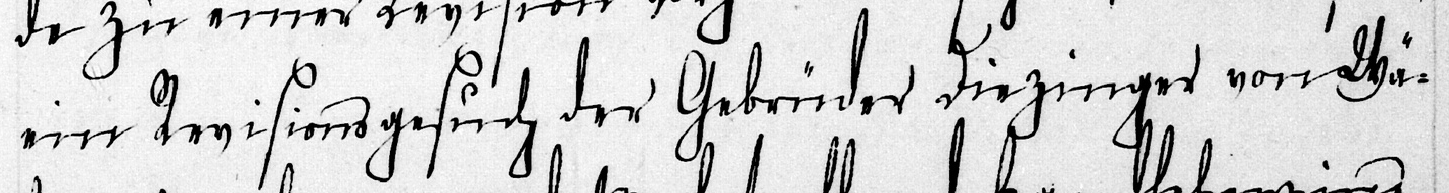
ein Revisionsgesuch der Gebrüder Diezinger von Wä¬
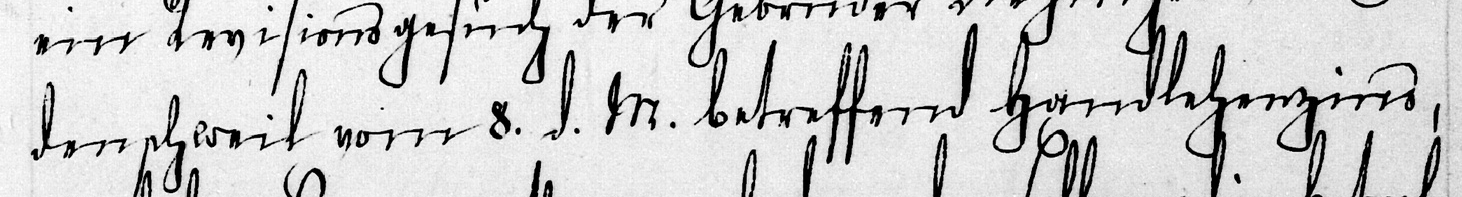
denschweil vom 8. d. M. betreffend Handlehenzins,
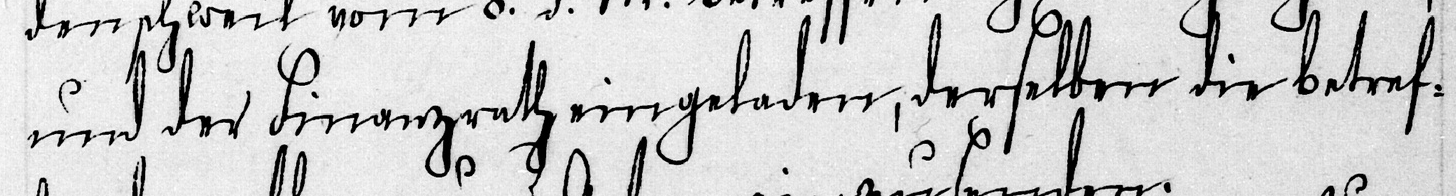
und der Finanzrath eingeladen, derselben die betref¬
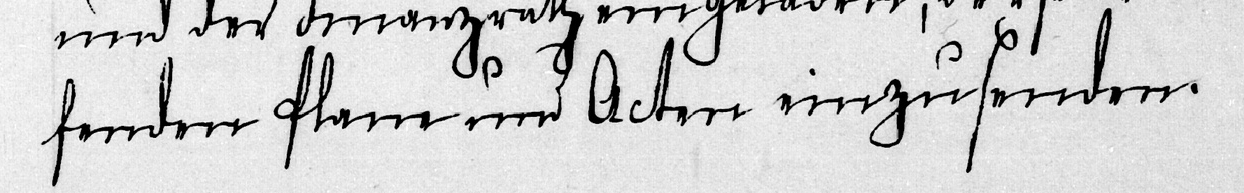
fenden Plane und Acten einzusenden.
